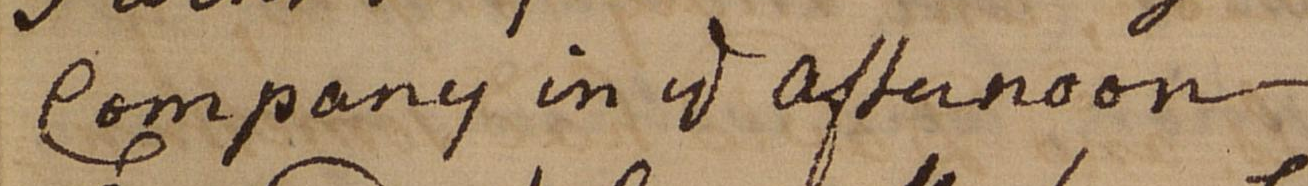Company in y^e afternoon
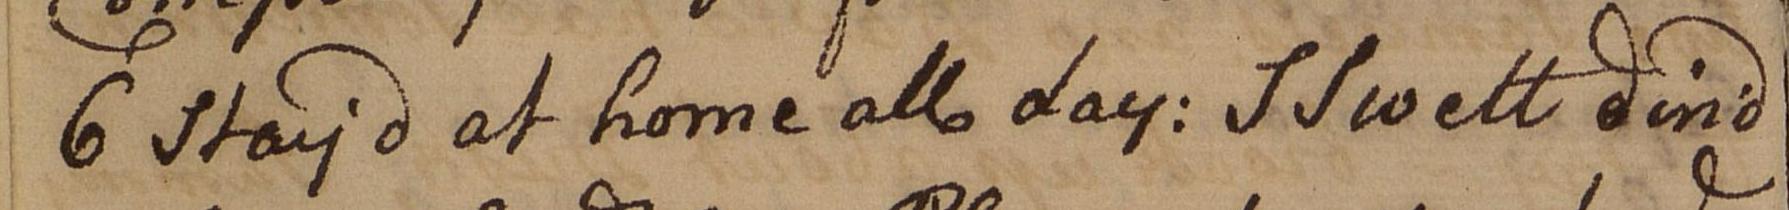6 stay'd at home all day: S Swett din'd
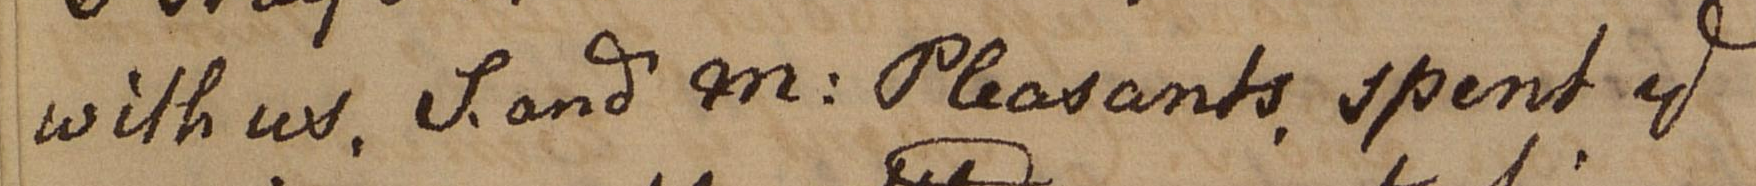with us, S. and M: Pleasants, spent y^e
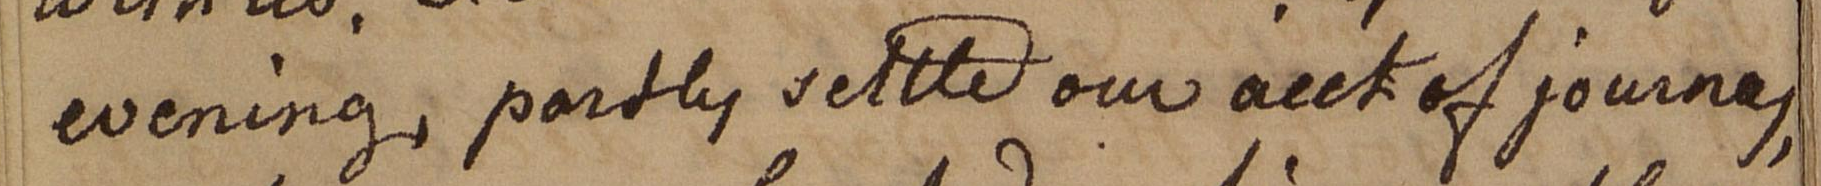evening, partly settld our acct of journey,
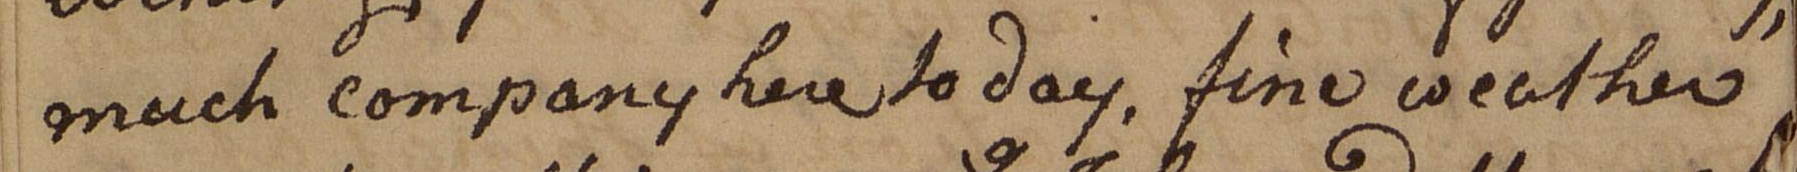much company here to day, fine weather
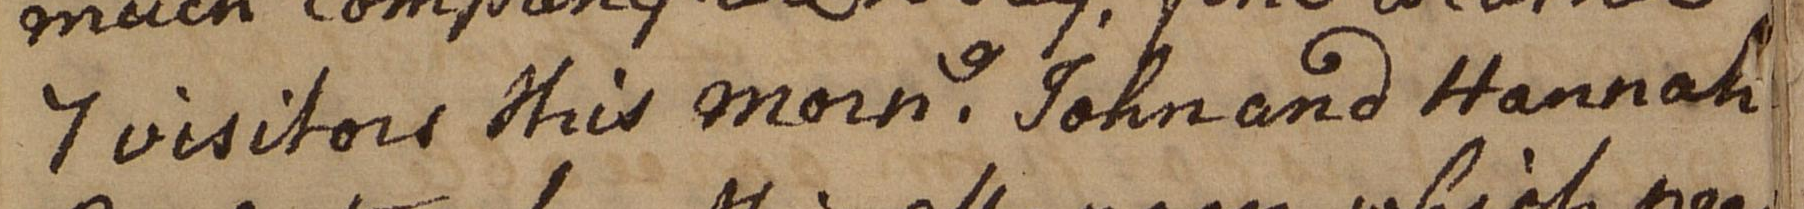7 visitors this morn^g. John and Hannah
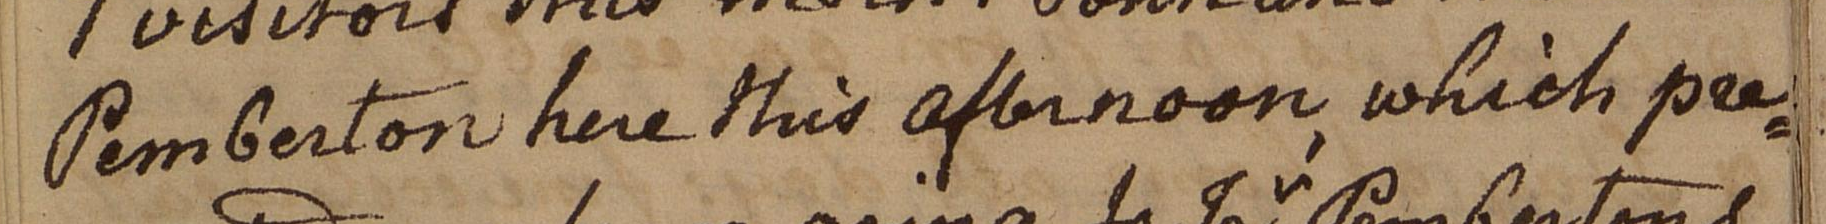Pemberton here this afternoon which pre-
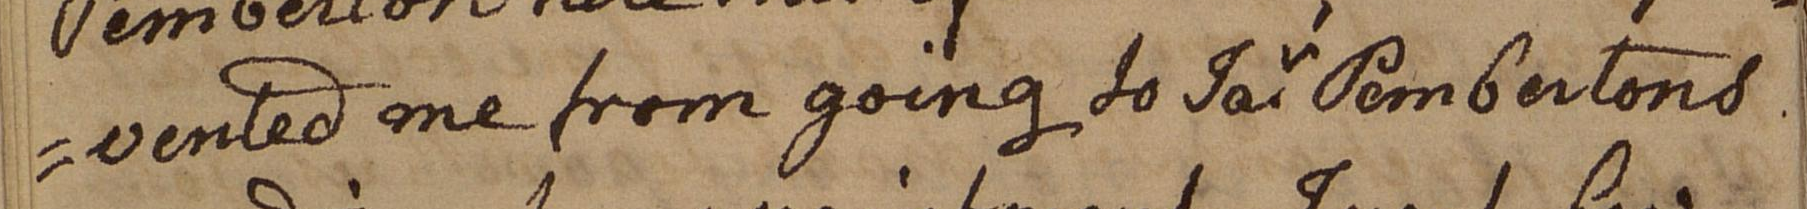-vented me from going to Jo^s. Pembertons
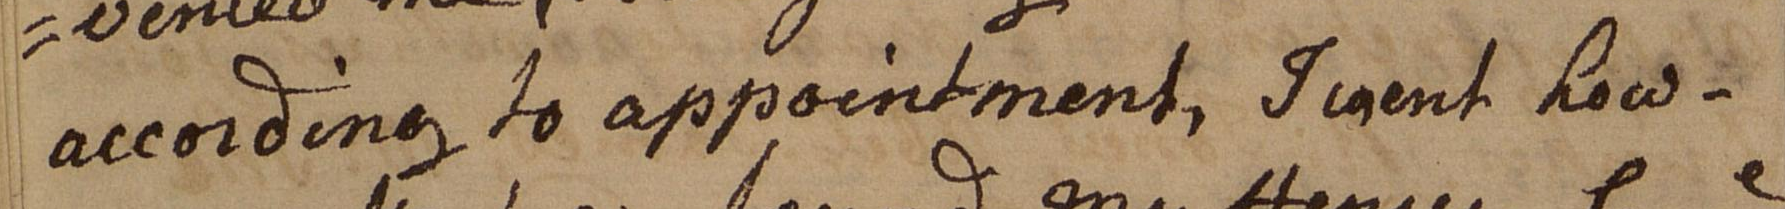according to appointment, I went how-
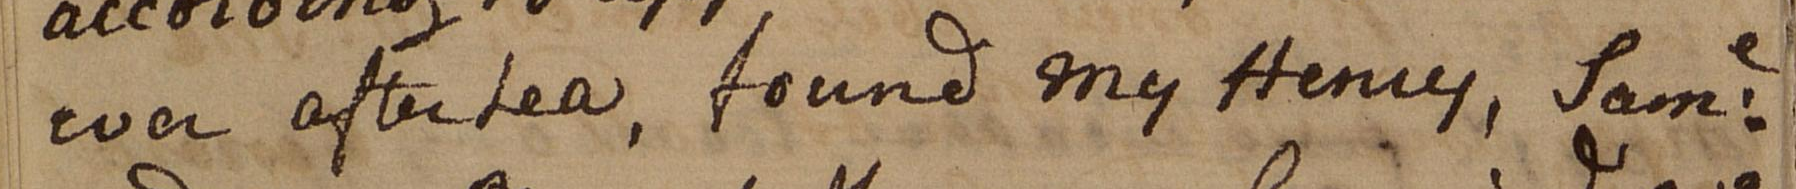ever after tea, found my Henry, Sam^l:
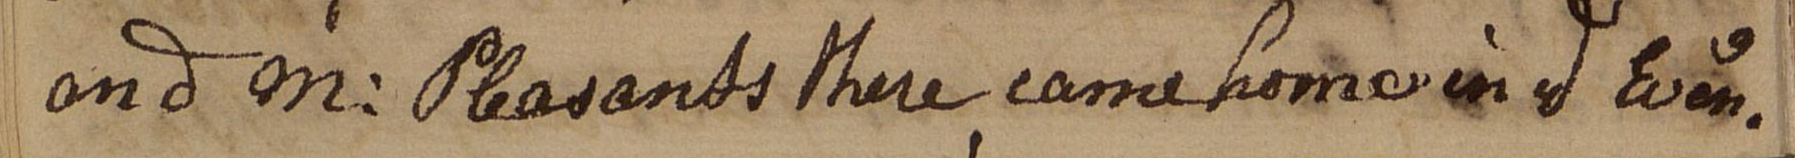and M: Pleasants there, came home in y^e Even^g.
